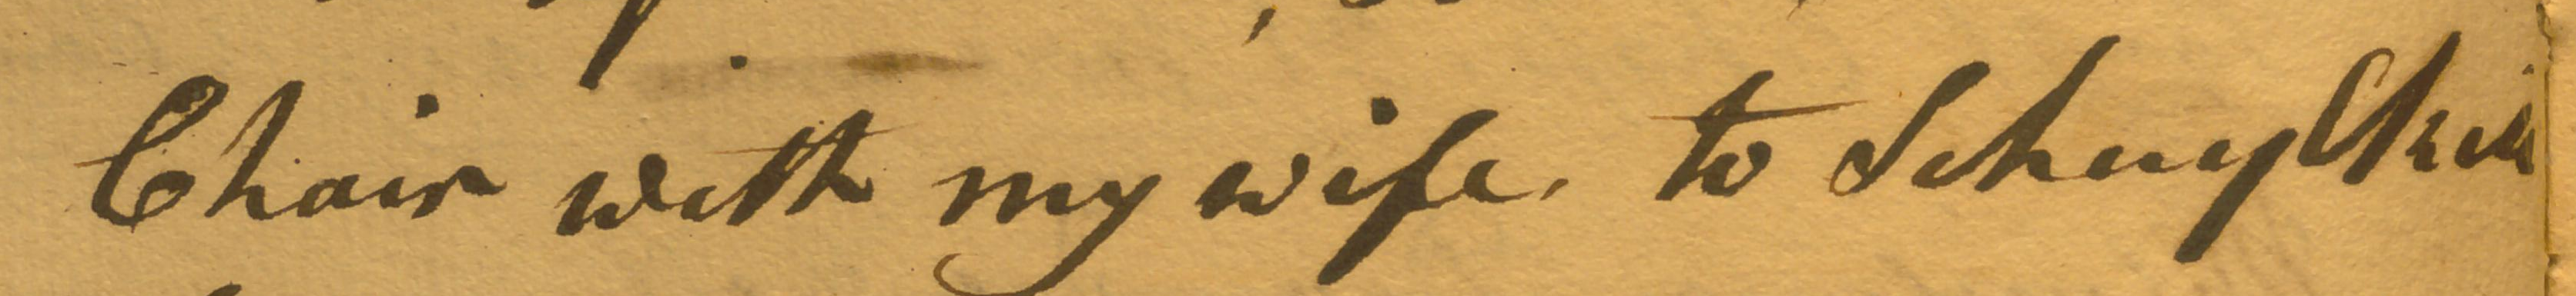Chair with my wife, to Schuylkil
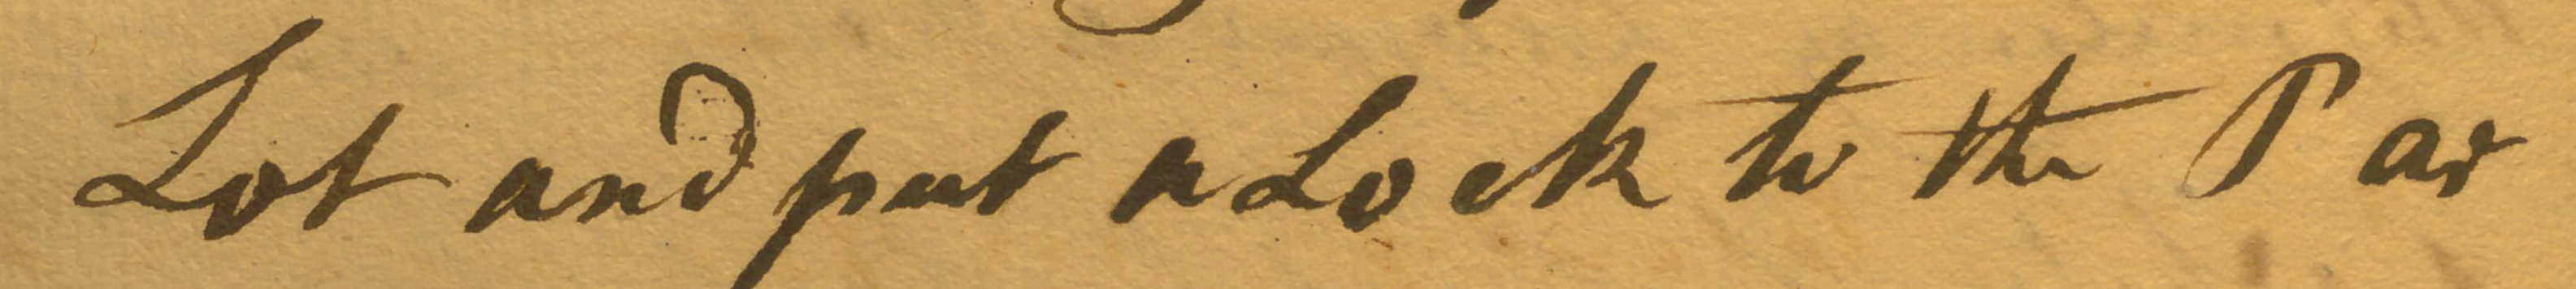Lot and put a Lock to the Par
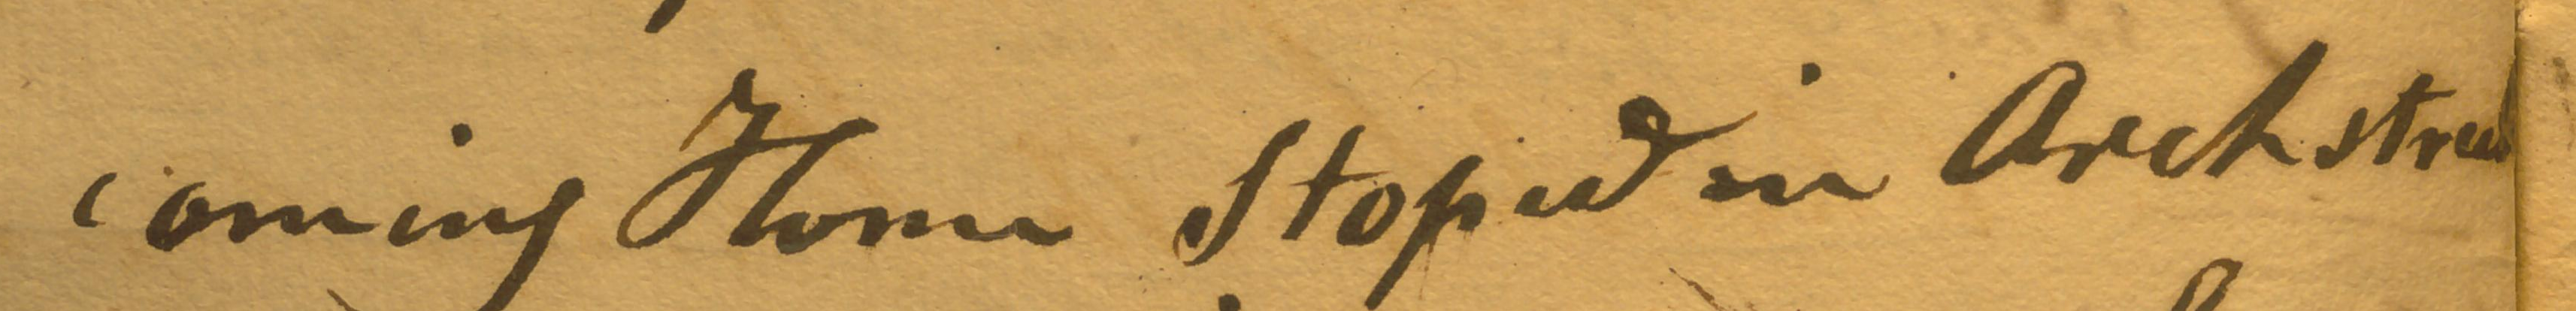coming Home Stoped on Arch street
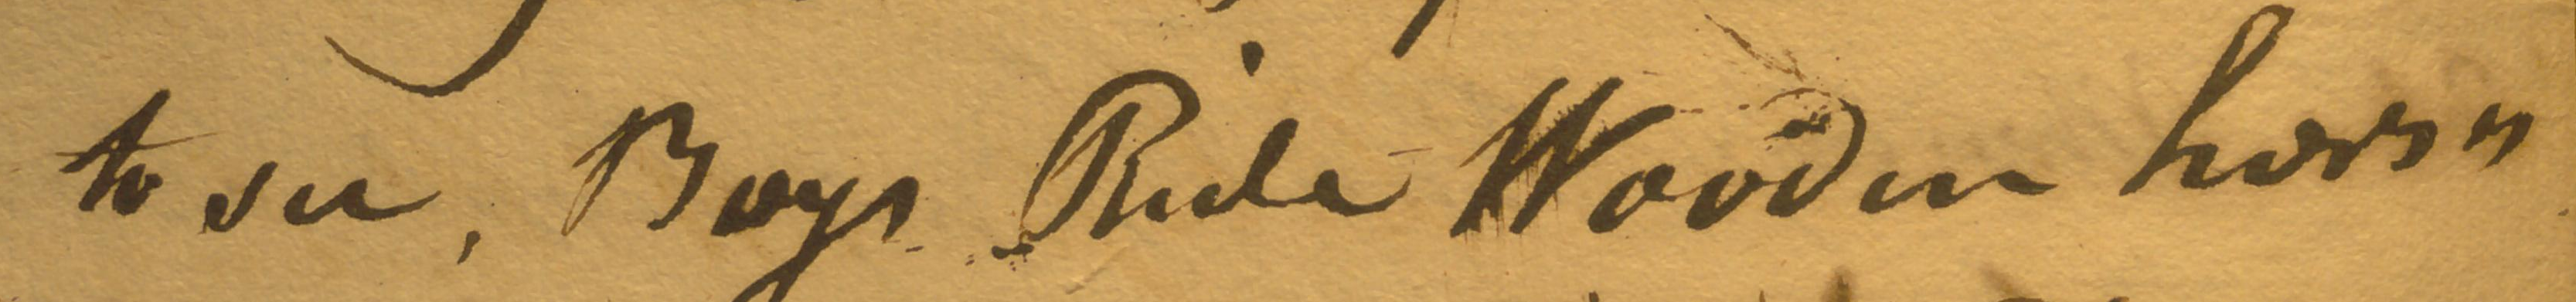to see. Bays Ride Wooden horses
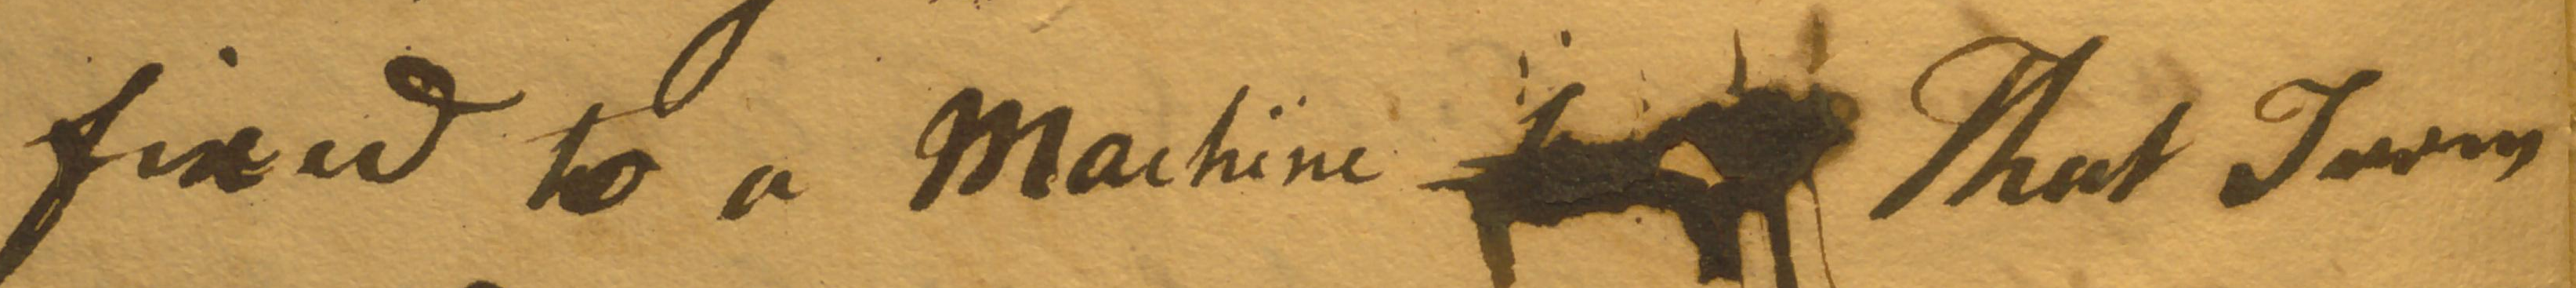fixed to a Machine [___] That Turns
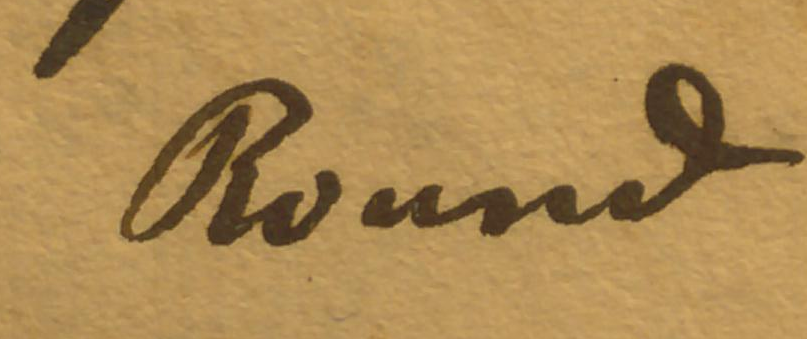Round
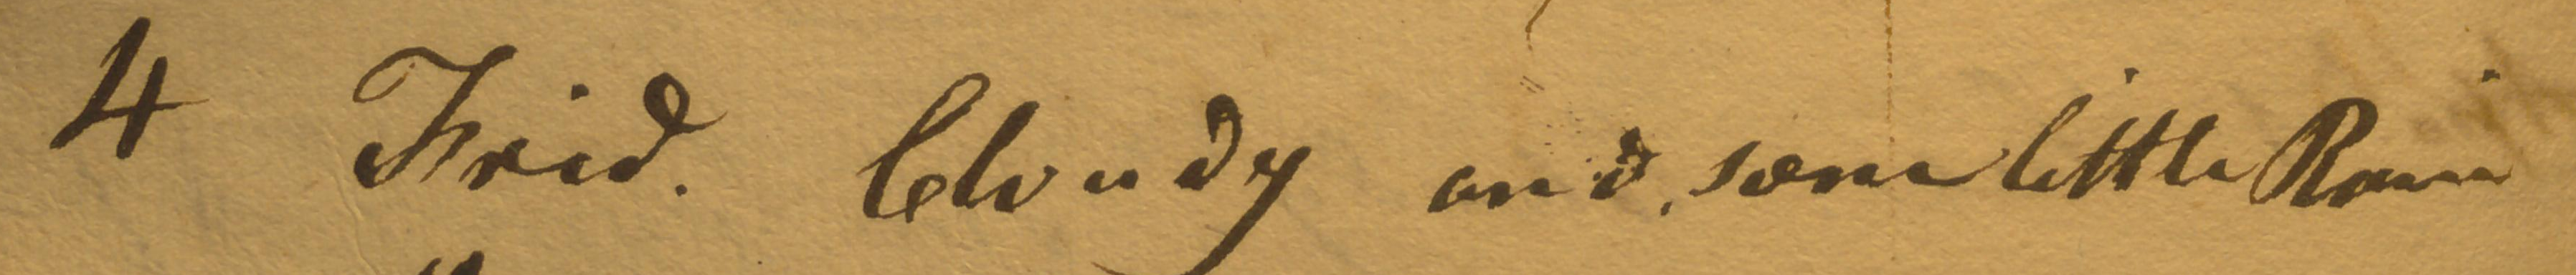4 Frid. Cloudy and some little Rain
